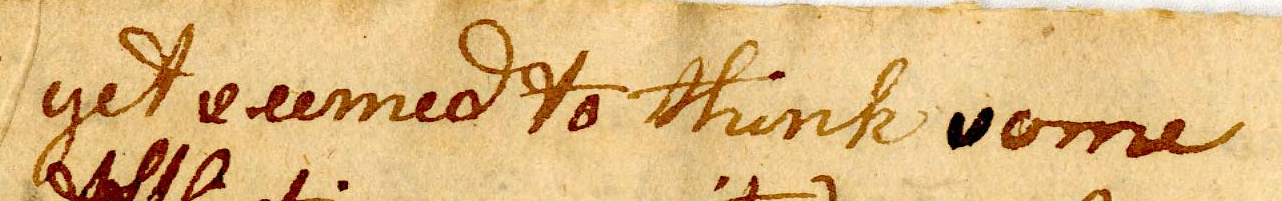yet seemed to think some
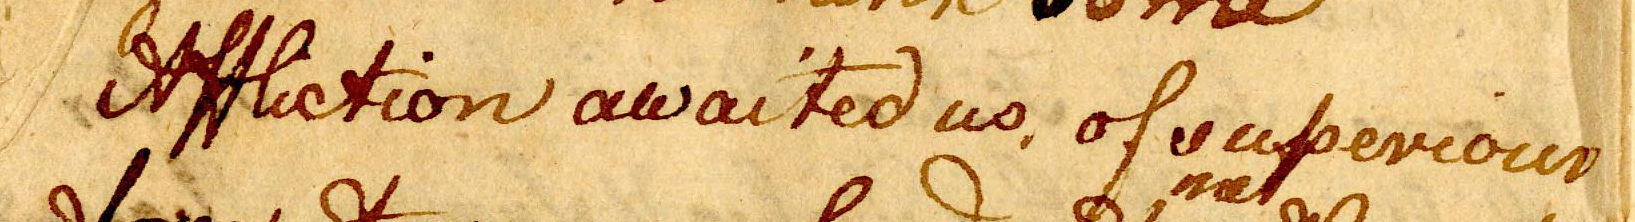Affliction awaited us, of superiour
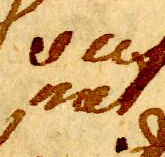met
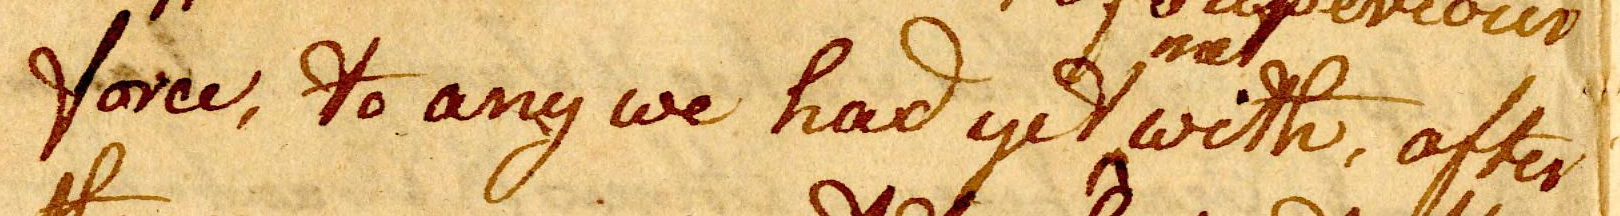force, to any we had yet ^ with, after
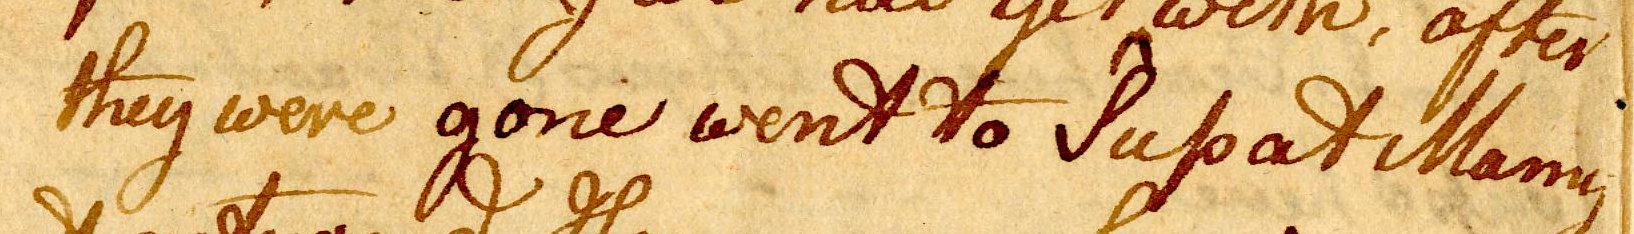they were gone went to Sup at Mamy
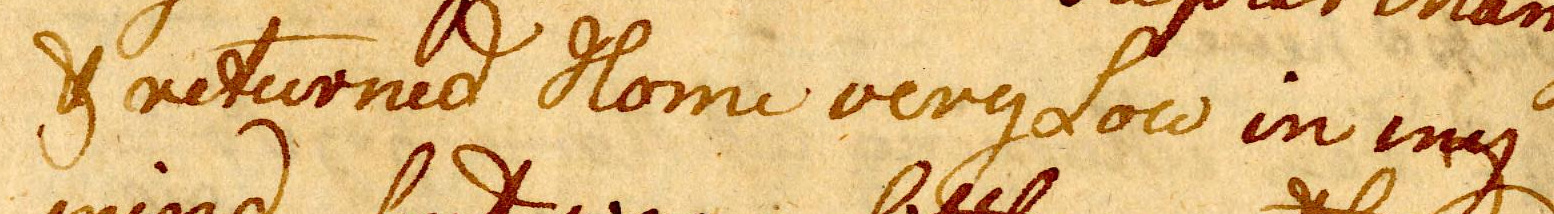& returned Home very Low in my
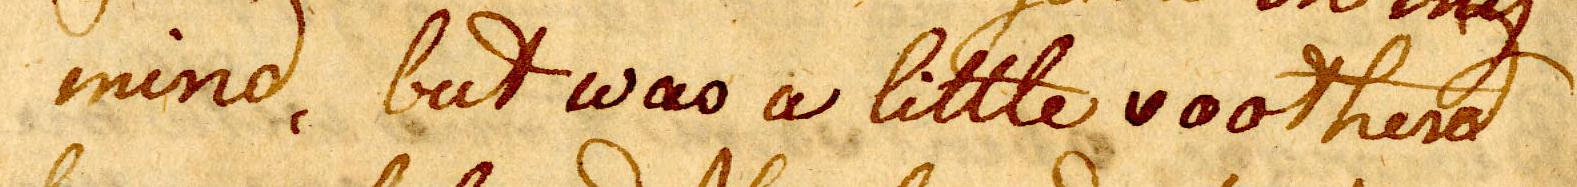mind, but was a little sootherd
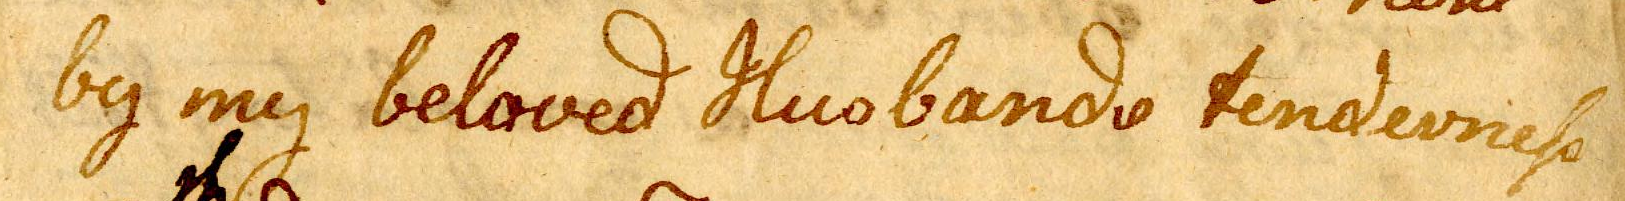by my beloved Husbands tenderness
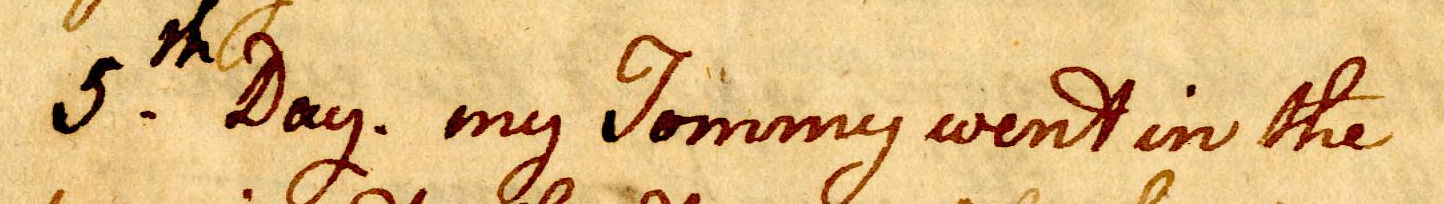5^th Day. my Tommy went in the
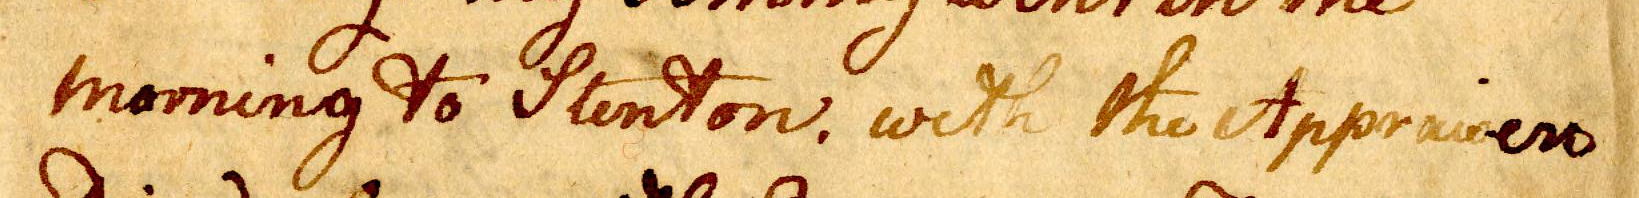morning to Stenton, with the Appraisers
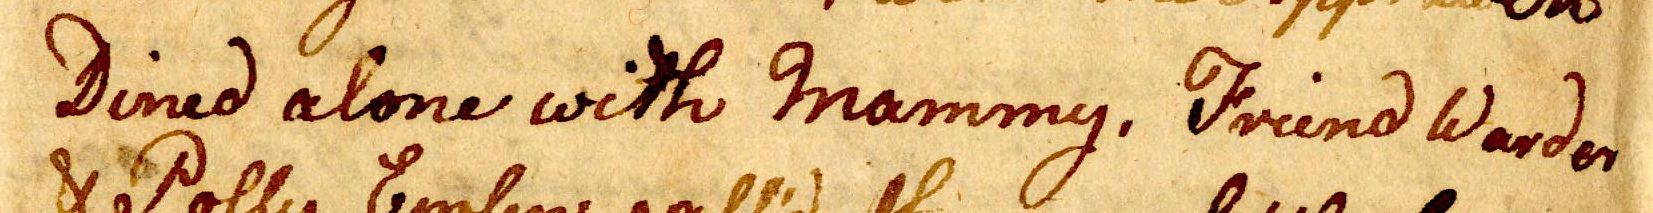Dined alone with Mammy, Friend Warden
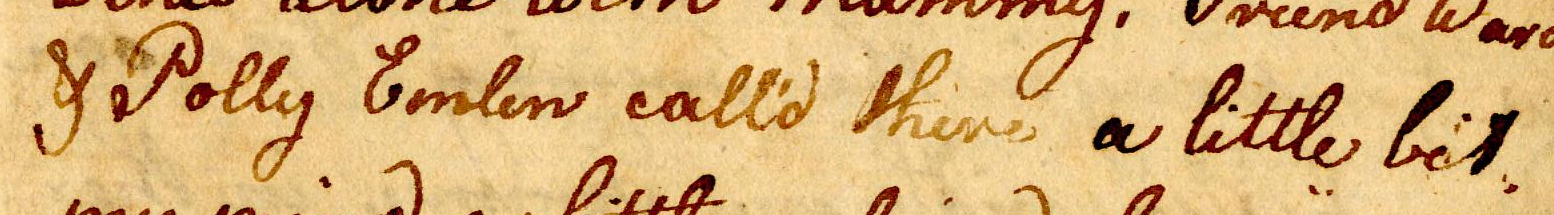& Polly Emlen call'd there a little bit
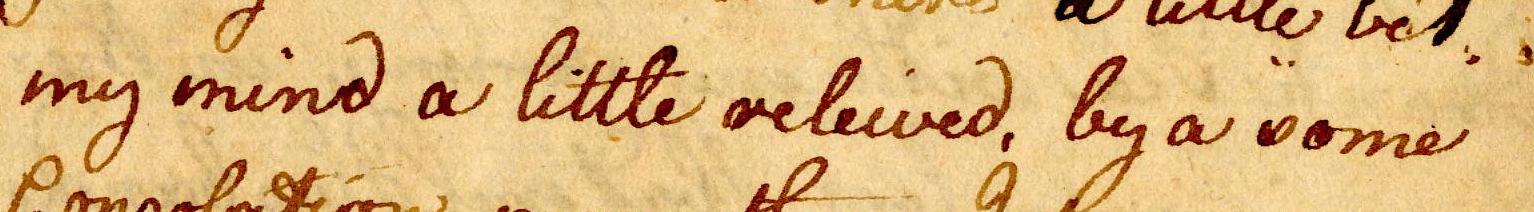my mind a little releived, by a some
